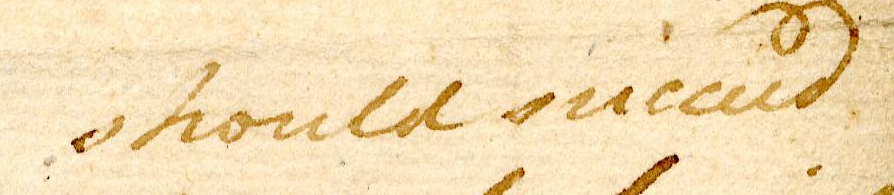should succeed
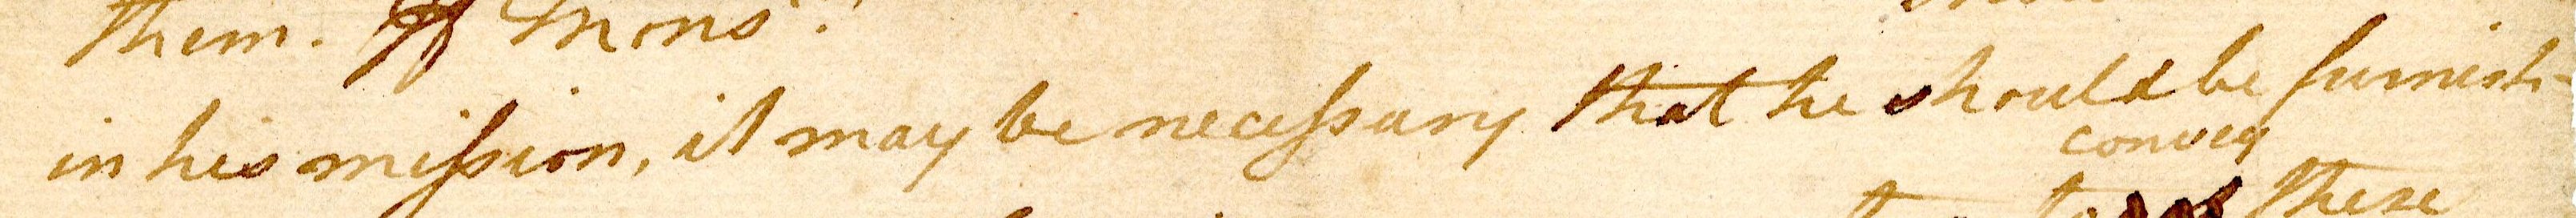in his mission, it may be necessary that he should be furnish
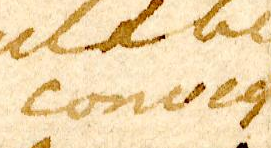convey
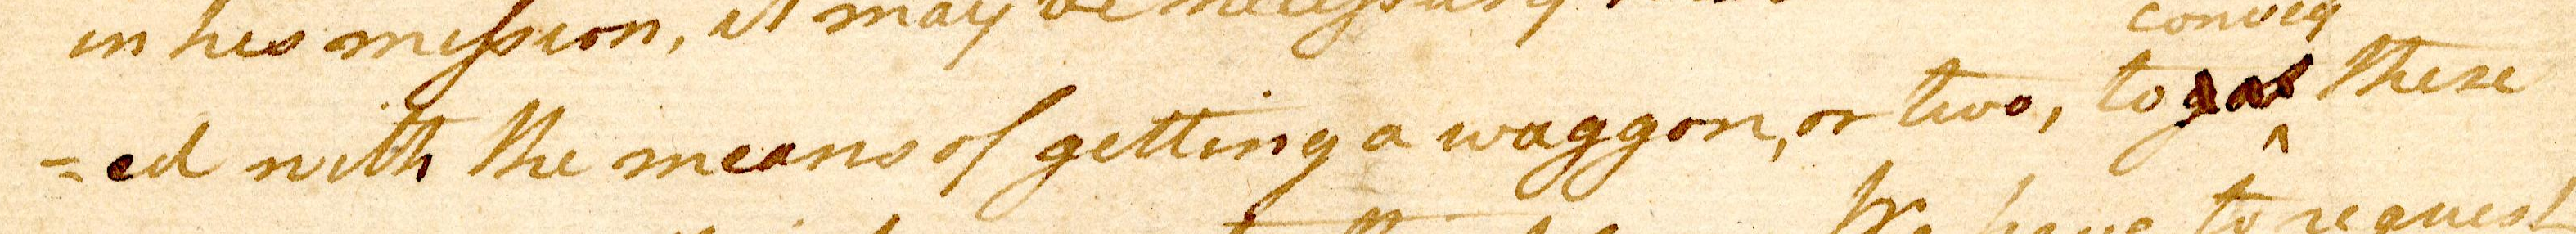-ed with the means of getting a waggon, or two, to get these
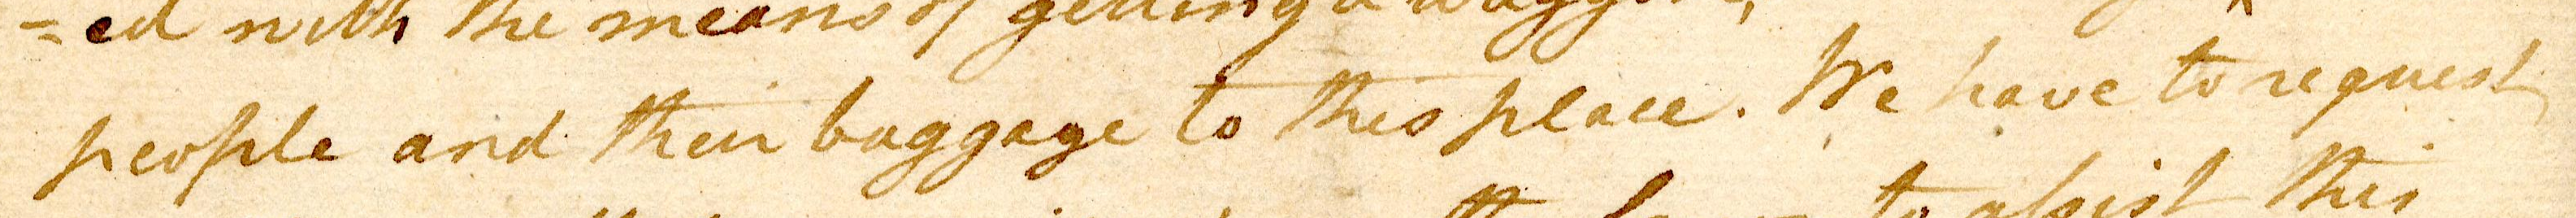people and their baggage to this place. We have to request
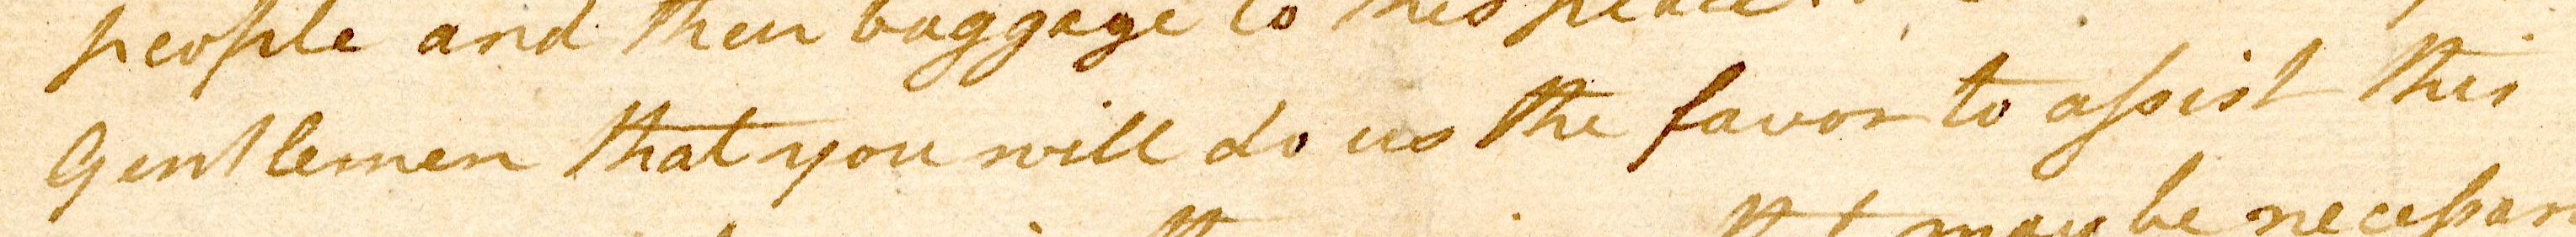Gentlemen that you will do us the favor to assist this
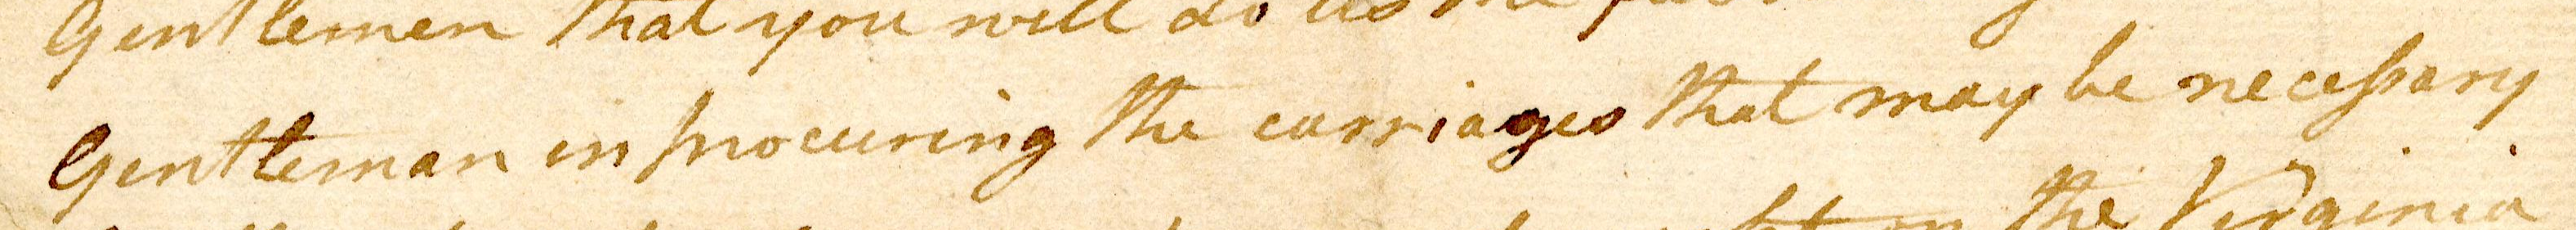Gentleman in procuring the carriages that may be necessary
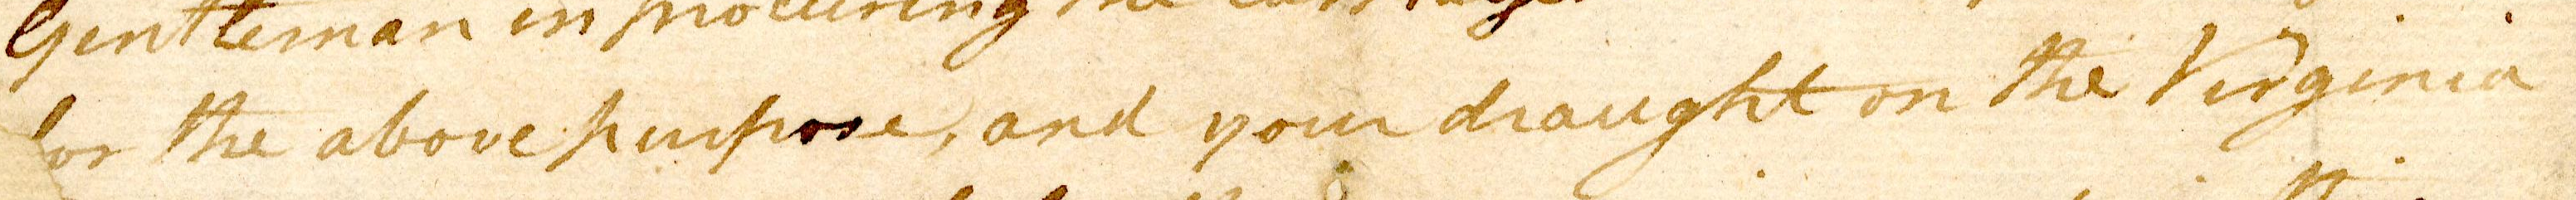for the above purpose, and your draught on the Virginia
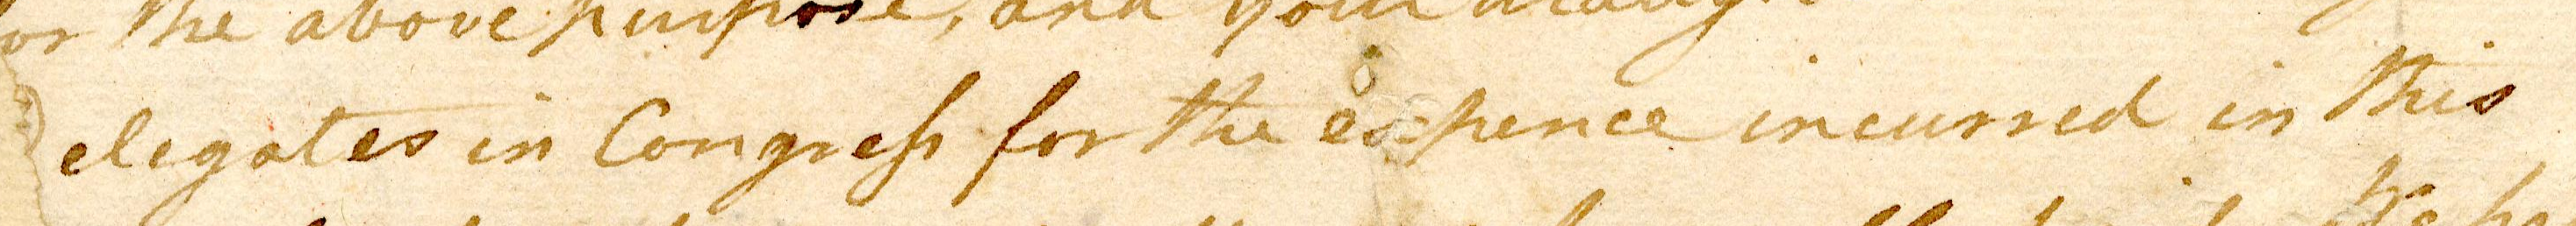Delegates in Congress for the expense incurred in this
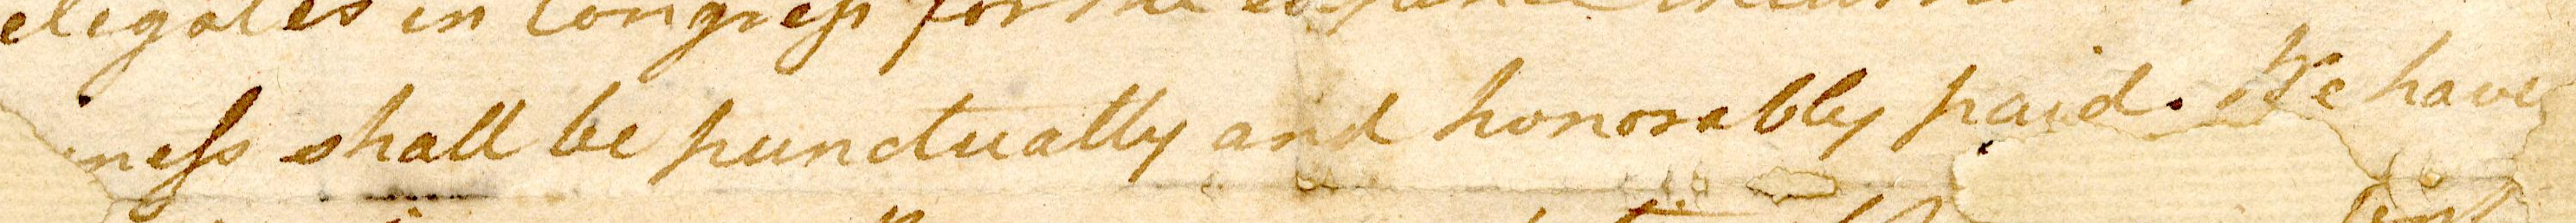iness shall be punctually and honorably paid. We have
